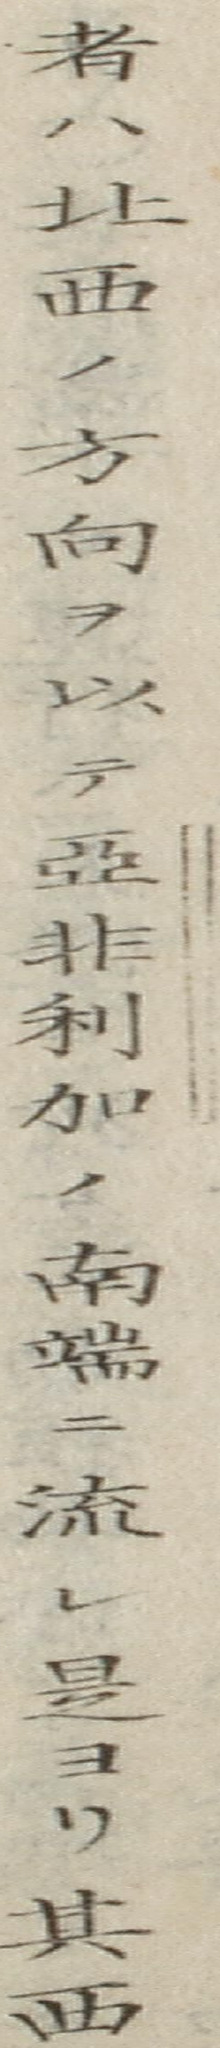者ハ北西ノ方向ヲ以テ亜非利加ノ南端ニ流レ是ヨリ其西
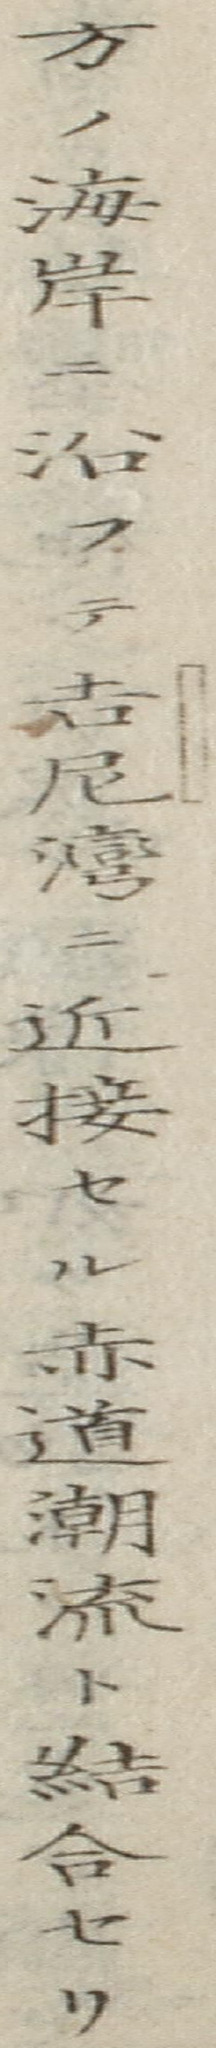方ノ海岸ニ沿フテ吉尼湾ニ近接セル赤道潮流ト結合セリ
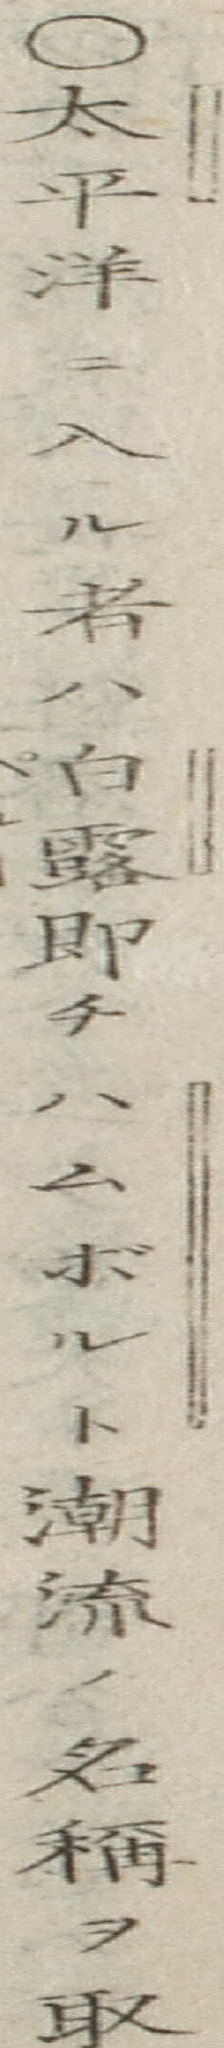○太平洋ニ入ル者ハ白露即チハムボルト潮流ノ名稍ヲ取
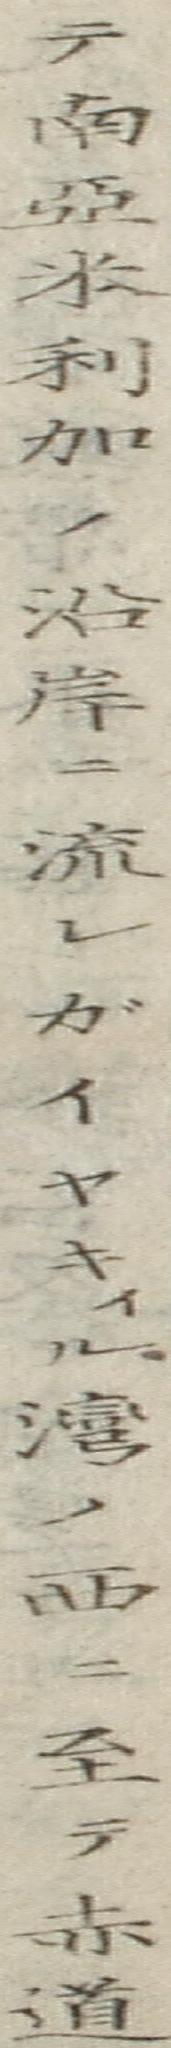テ南亜米利加ノ沿岸ニ流レガイヤキィル湾ノ西ニ至テ赤道
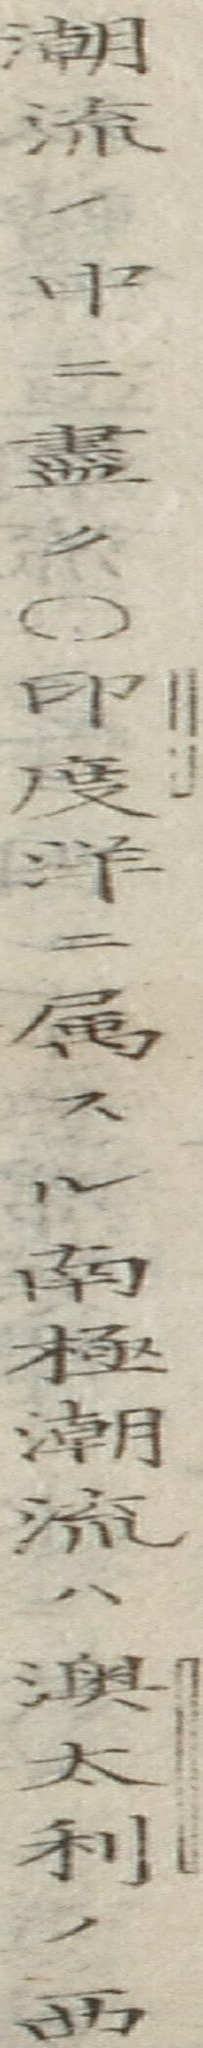潮流ノ中ニ尽ク○印度洋ニ属スル南極潮流ハ澳太利ノ西
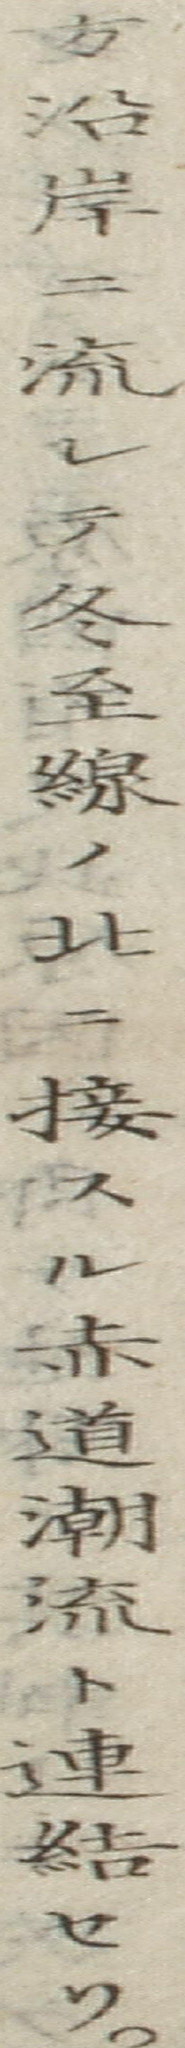方沿岸ニ流レテ冬至線ノ北ニ接スル赤道潮流ト連結セリ。
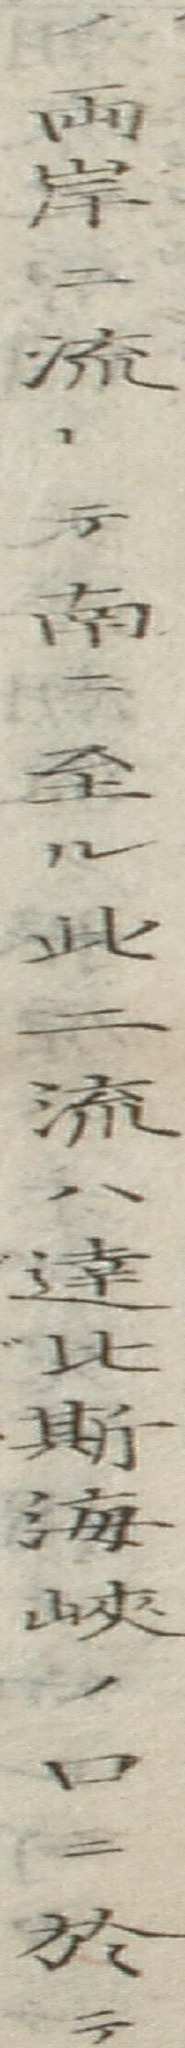ノ両岸ニ流レテ南ニ至ル此二流ハ達比斯海峡ノ口ニ於テ
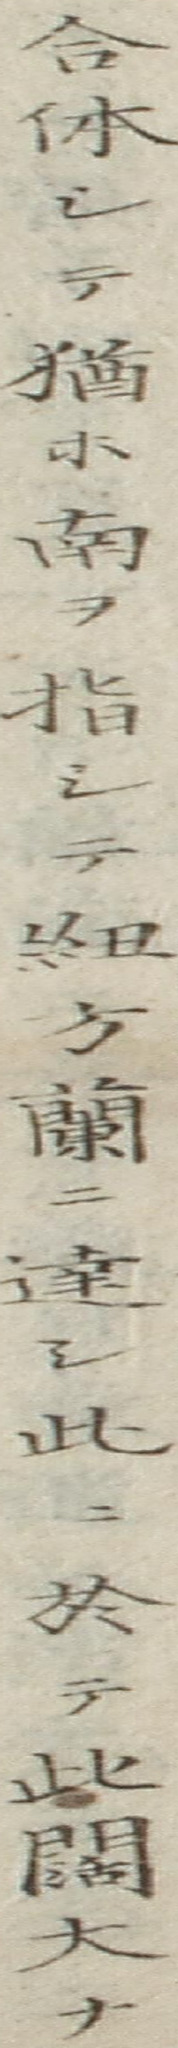合体シテ猶ホ南ヲ指シテ紐方蘭ニ達シ此ニ於テ此闊大ナ
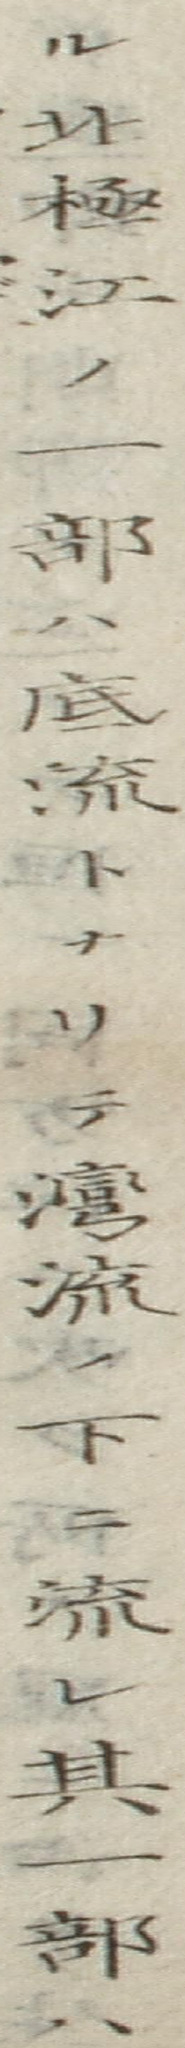ル北極江ノ一部ハ底流トナリテ湾流ノ下ニ流レ其一部ハ
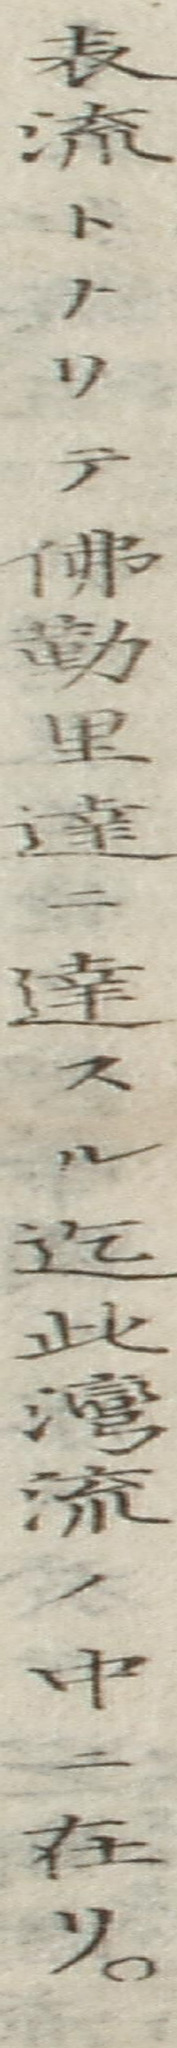表流トナリテ佛勤里達ニ達スル迄此湾流ノ中ニ在リ。
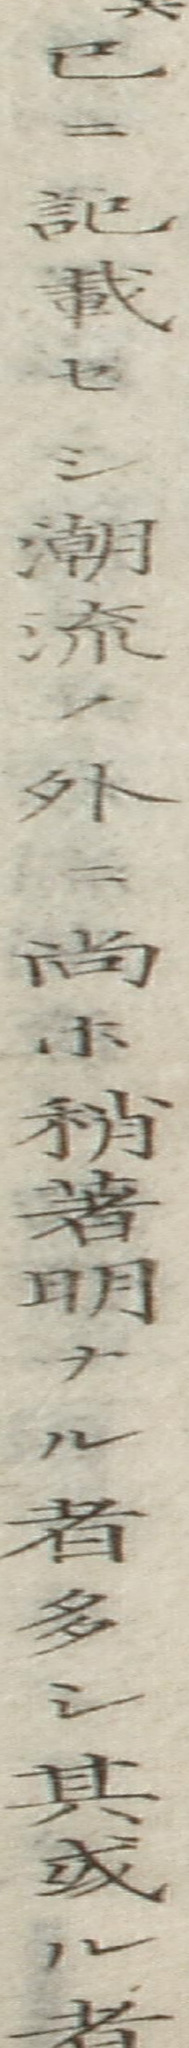卅六已ニ記載セシ潮流ノ外ニ尚ホ稍著明ナル者多シ其或ル者
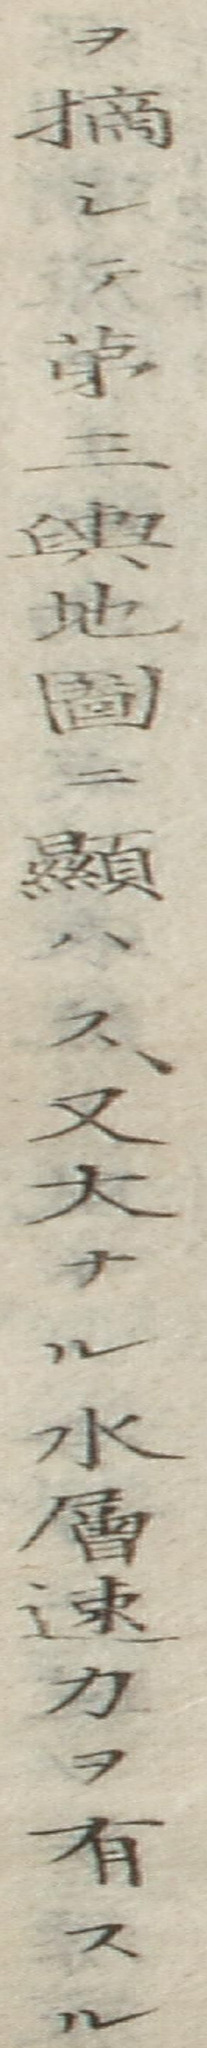ヲ摘シテ大三輿地図ニ顕ハス、又大ナル水層速力ヲ有スル

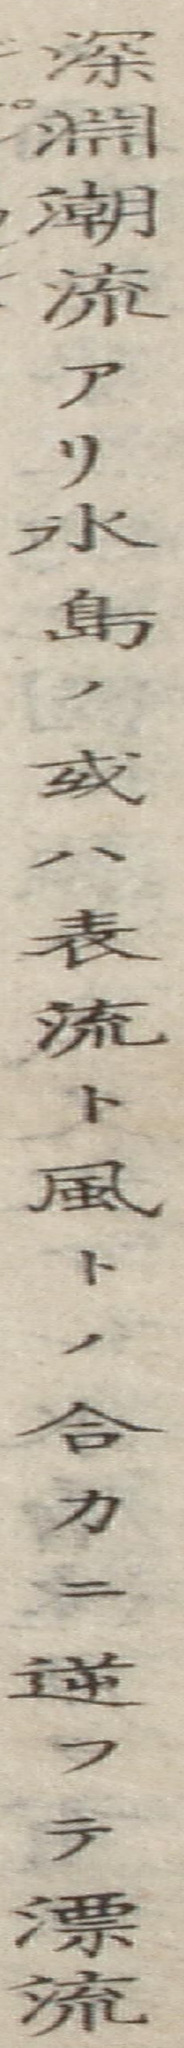深淵潮流アリ氷島ノ或ハ表流ト風トノ合力ニ逆フテ漂流
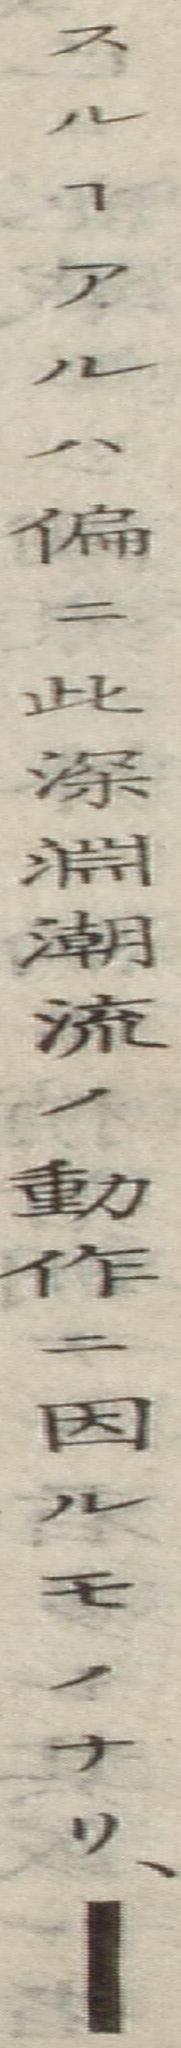スルヿアルハ偏ニ此深淵潮流ノ動作ニ因ルモノナリ、
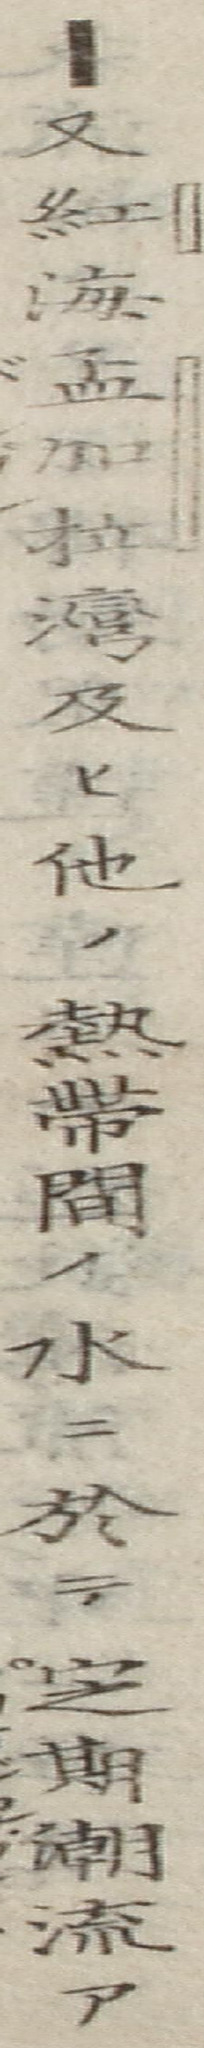又紅海孟加拉湾及ヒ他ノ熱帯間ノ水ニ於テ定期潮流ア
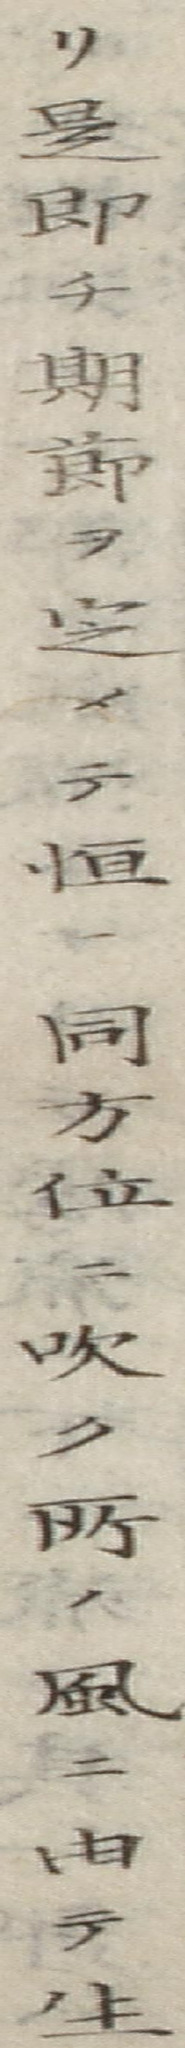リ是即チ期節ヲ定メテ恒ニ同方位ニ吹ク所ノ風ニ由テ生
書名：地形論　巻二
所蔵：東京大学地震研究所図書室 Earthquake Research Institute Library, The University of Tokyo, JAPAN
